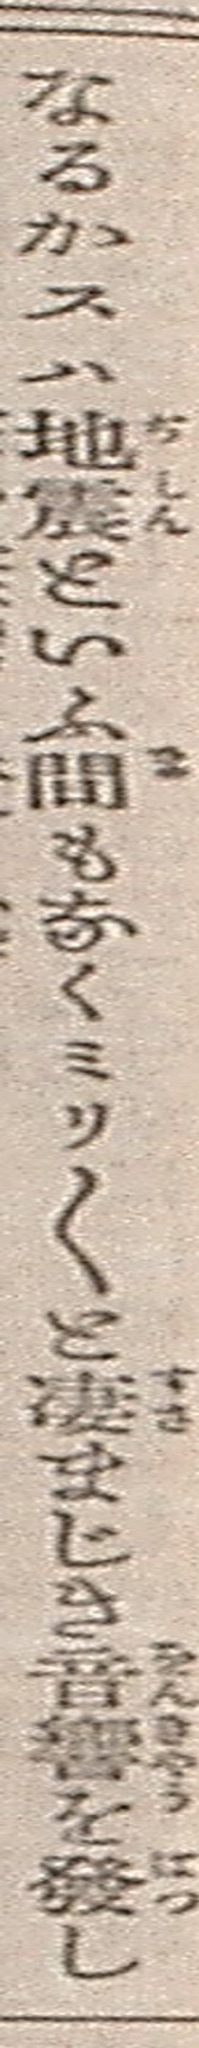なるかスハ地震といふ間もなくミリ〳〵と凄まじき音響を発し
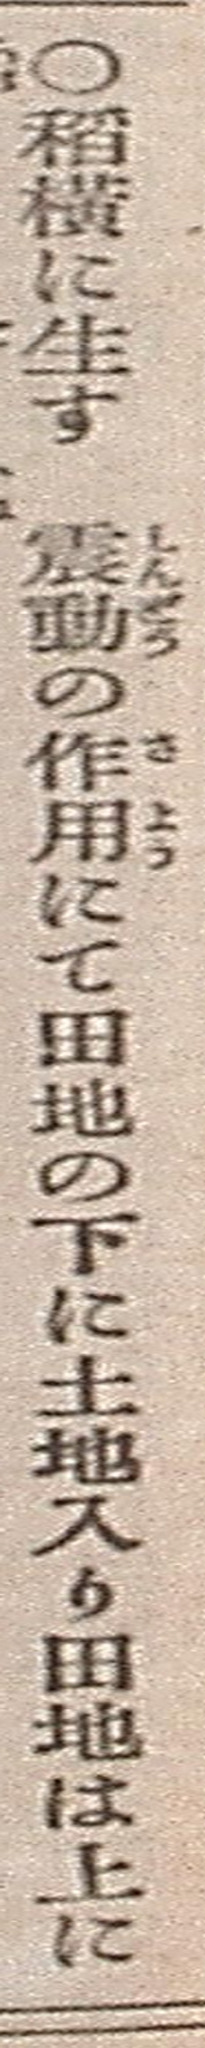〇稲横に生す震動の作用にて田地の下に土地入り田地は上に
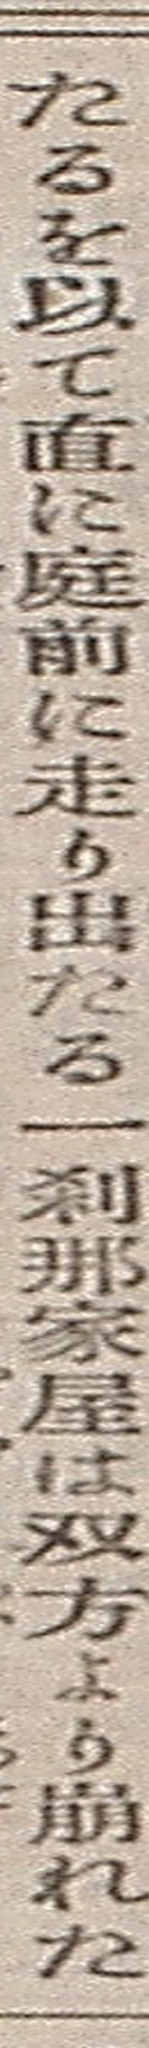たるを以て直に庭前に走り出たる一刹那家屋は双方より崩れた
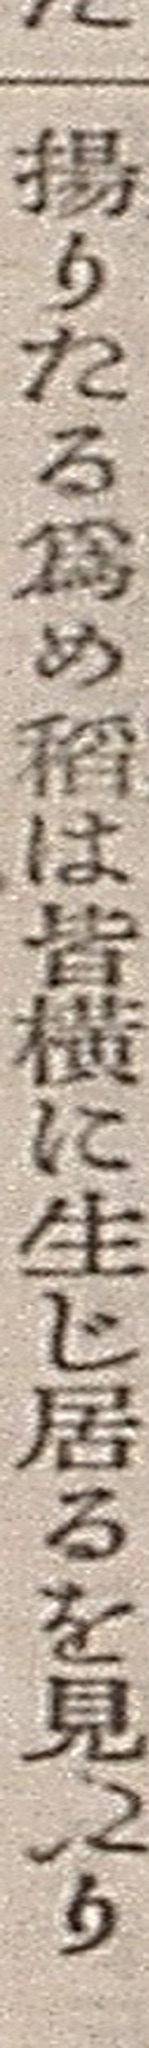揚りたる為め稲は皆横に生じ居るを見えり
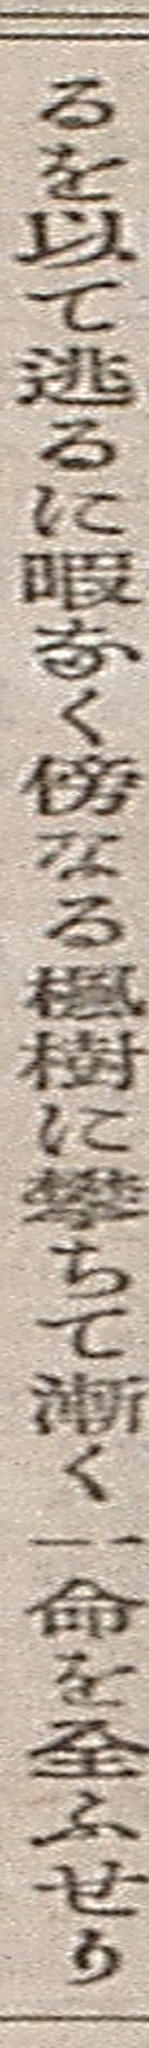るを以て逃るに暇なく傍なる楓樹に攀ちて漸く一命を全ふせり
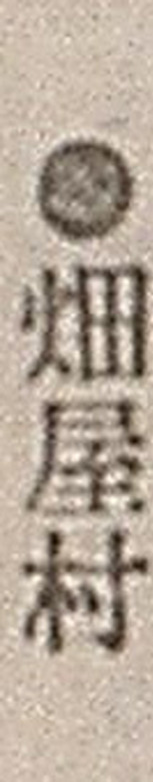●畑屋村
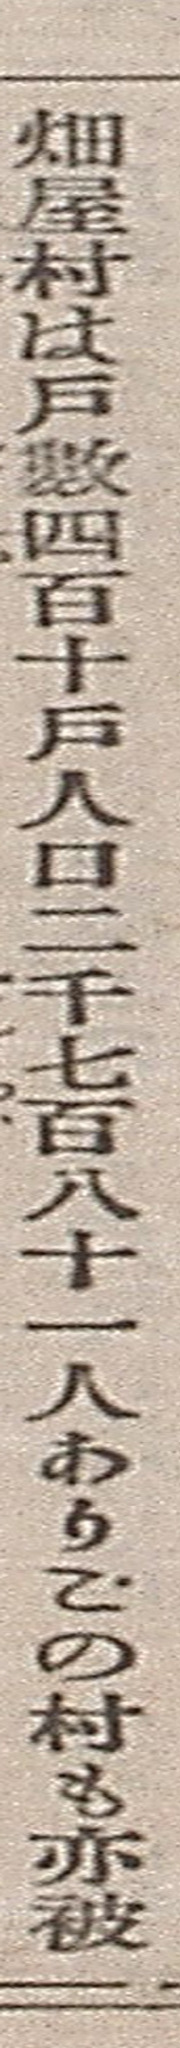畑屋村は戸数四百十戸人口二千七百八十一人ありこの村も亦被
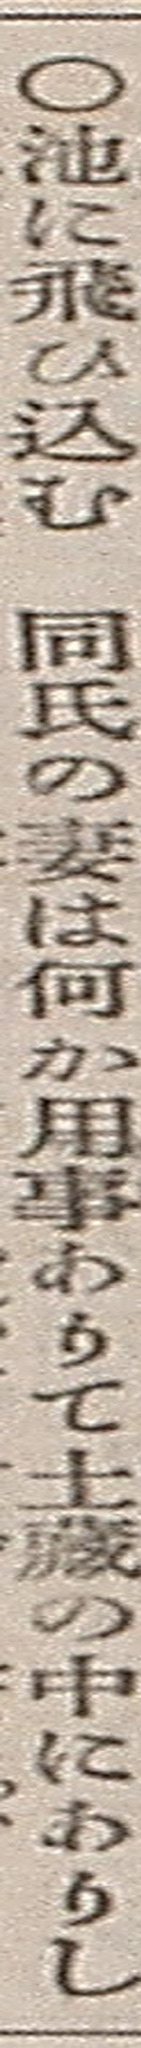〇池に飛ひ込む同氏の妻は何か用事ありて土蔵の中にありし
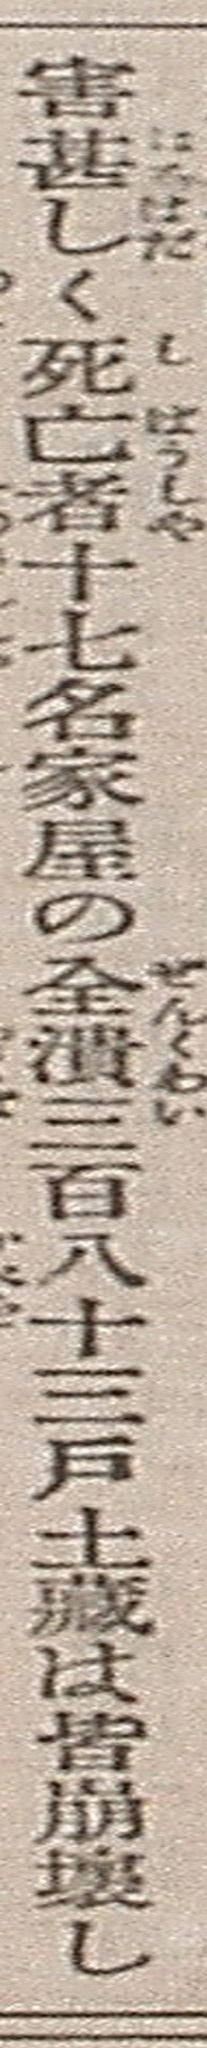害甚しく死亡者十七名家屋の全潰三百八十三戸土蔵は皆崩壊し
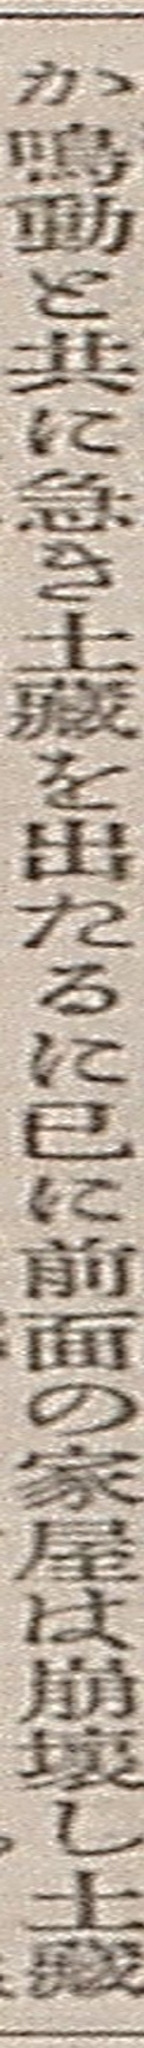か鳴動と共に急き土蔵を出たるに已に前面の家屋は崩壊し土蔵
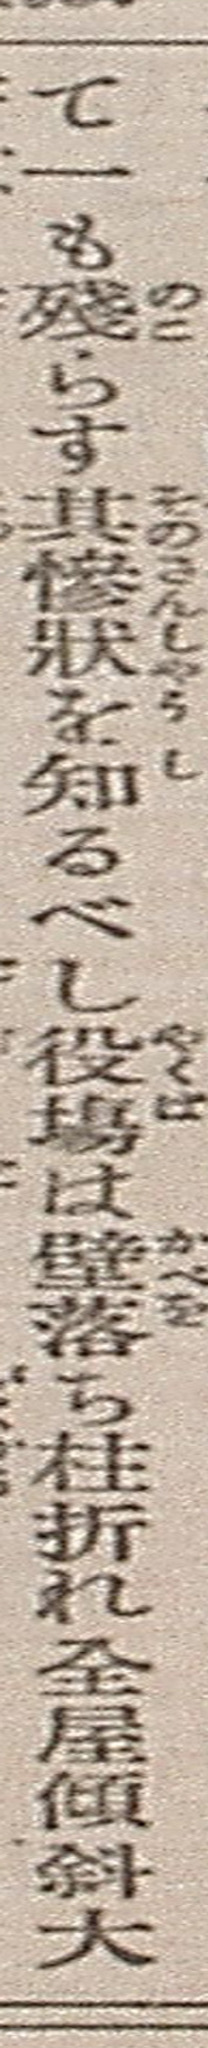て一も残らす其惨状を知るべし役場は壁落ち柱折れ全屋傾斜大
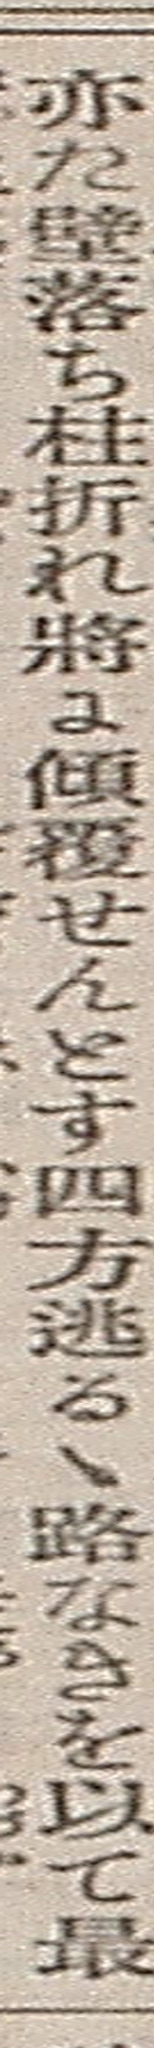亦た壁落ち柱折れ将に傾覆せんとす四方逃るゝ路なきを以て最
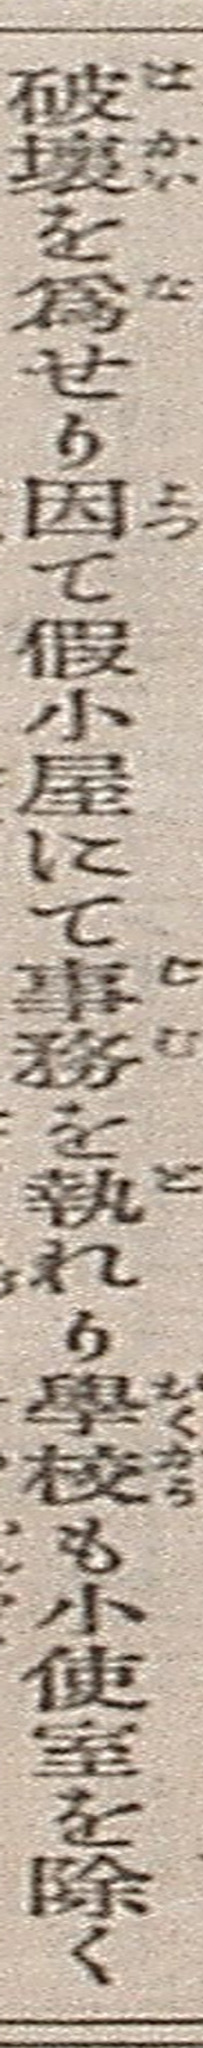破壊を為せり因て仮小屋にて事務を執れり学校も小使室を除く
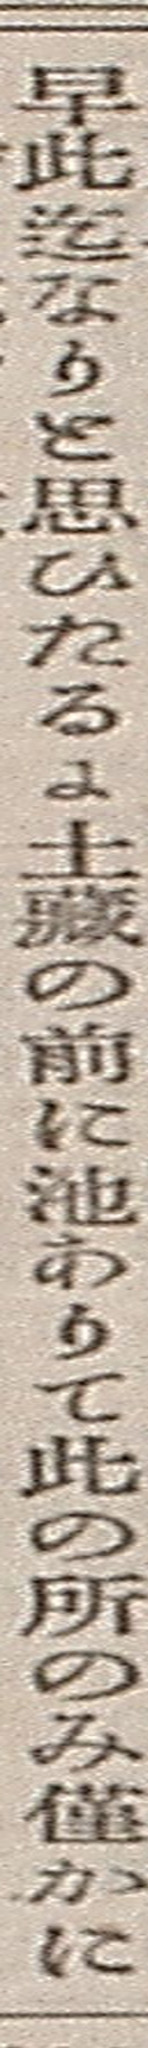早此迄なりと思ひたるに土蔵の前に池ありて此の所のみ僅かに
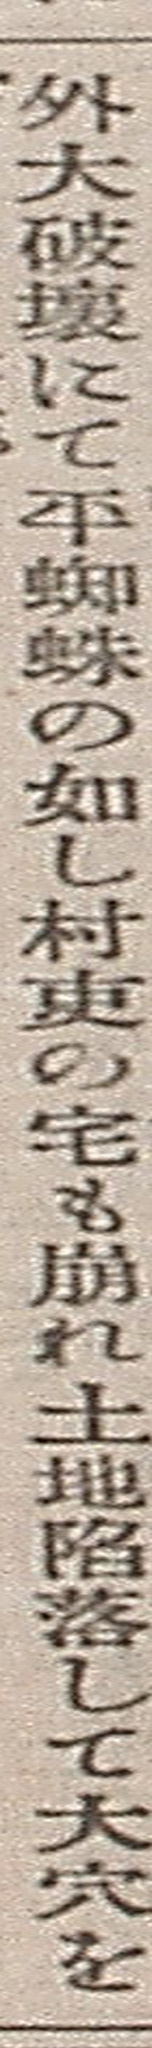外大破壊にて平蜘蛛の如し村吏の宅も崩れ土地陥落して大穴を
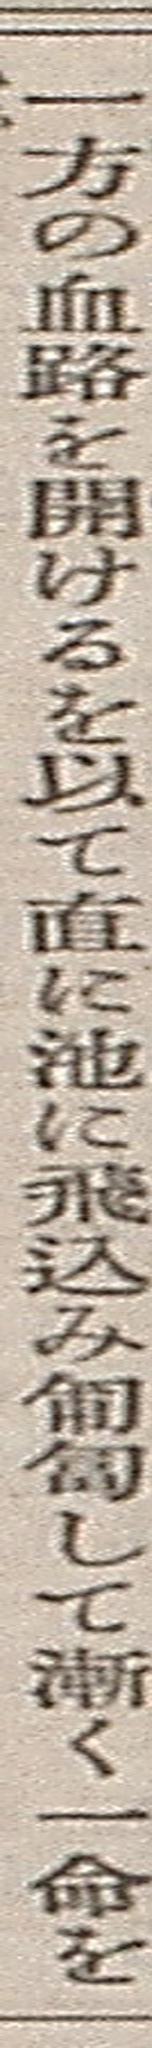一方の血路を開けるを以て直に池に飛込み匍匐して漸く一命を
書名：風俗畫報臨時増刊第百二十四號　洪水地震被害録（上）
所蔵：東京大学地震研究所図書室 Earthquake Research Institute Library, The University of Tokyo, JAPAN
